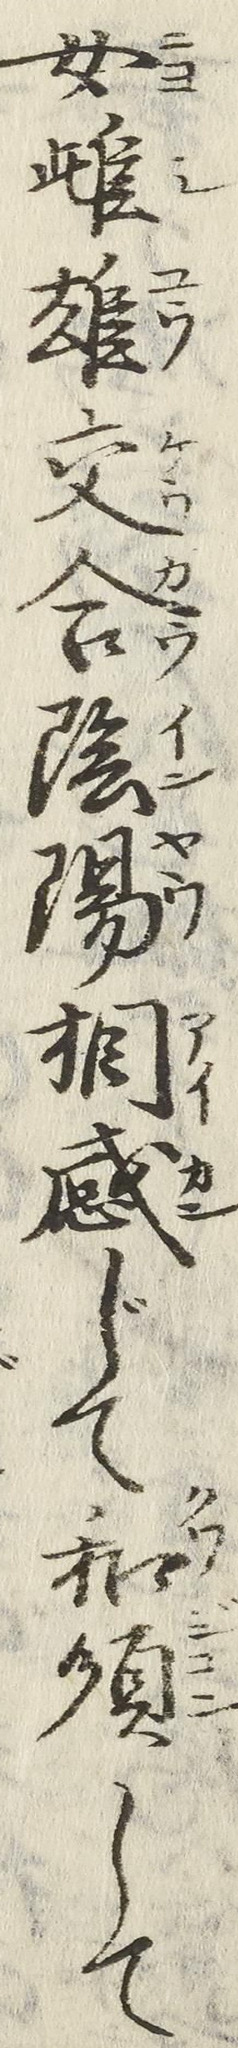女雌雄交合陰陽相感じて和順して
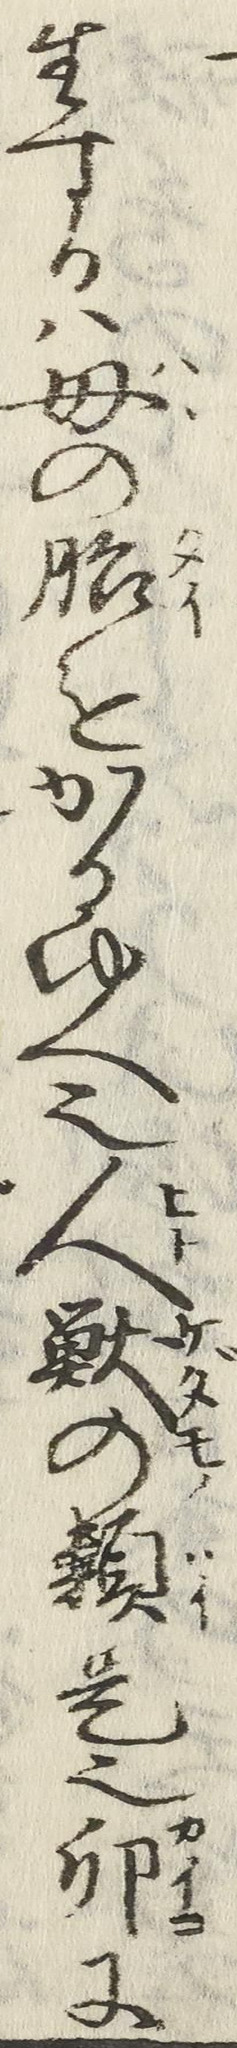生するは母の胎をかるゆへ也人獣の類是也卵に
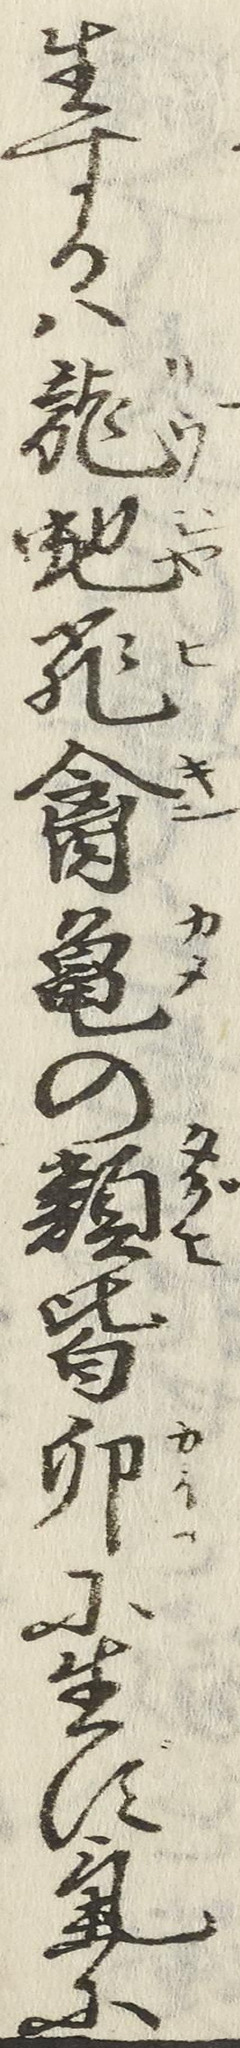生するは龍蛇飛禽亀の類皆卵に生ず気に
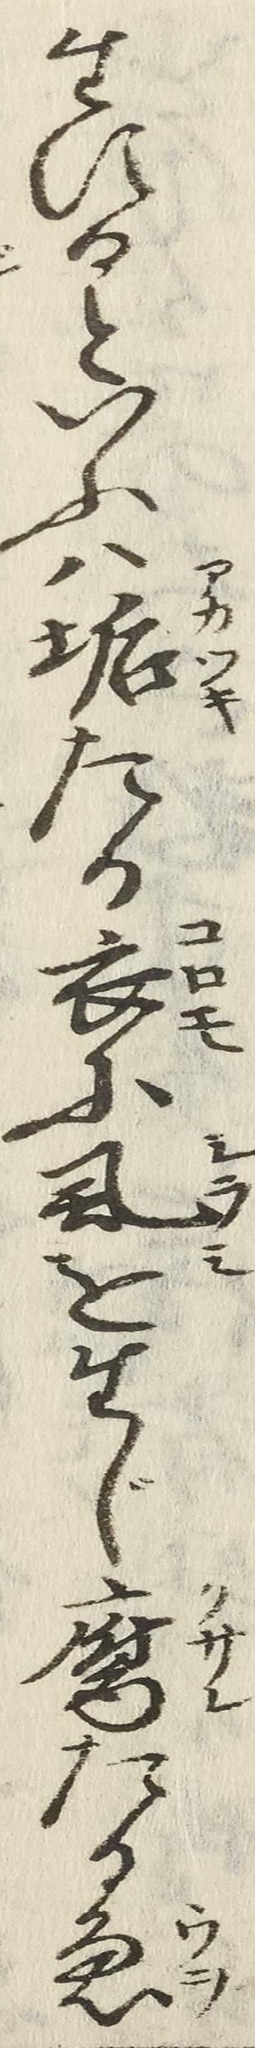生するといふは垢たる衣に虱を生じ腐たる魚
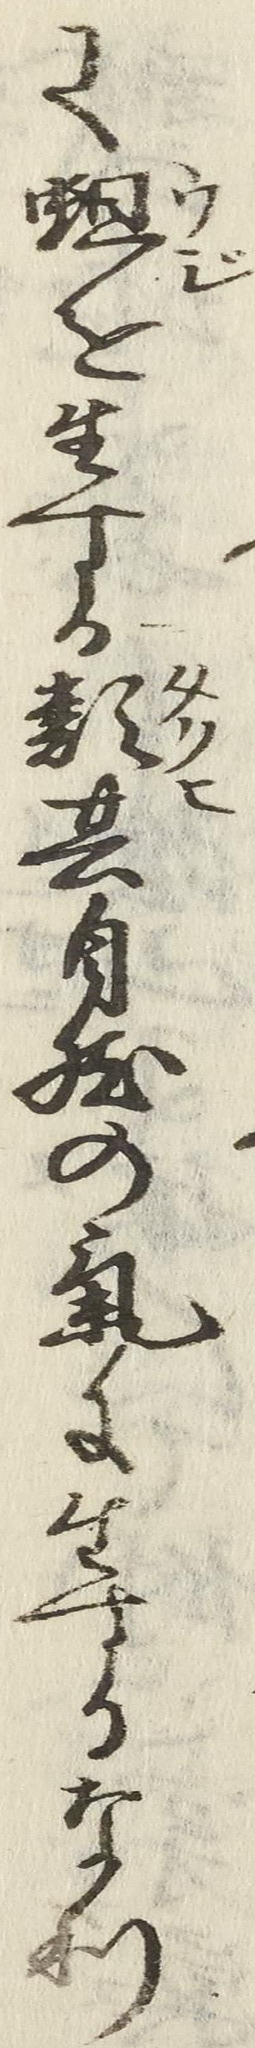に蛆を生する類其自然の気に生するなり
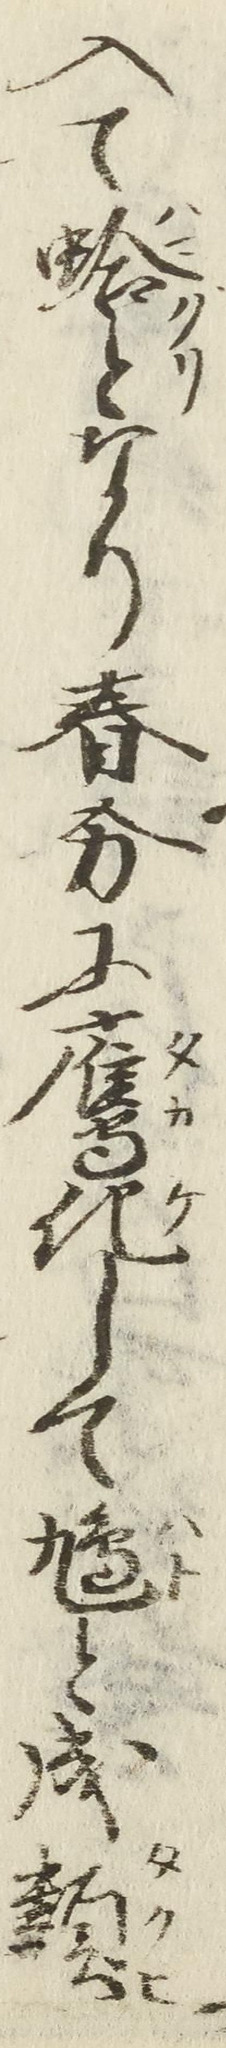入て蛤となり春分に鷹化して鳩と成類
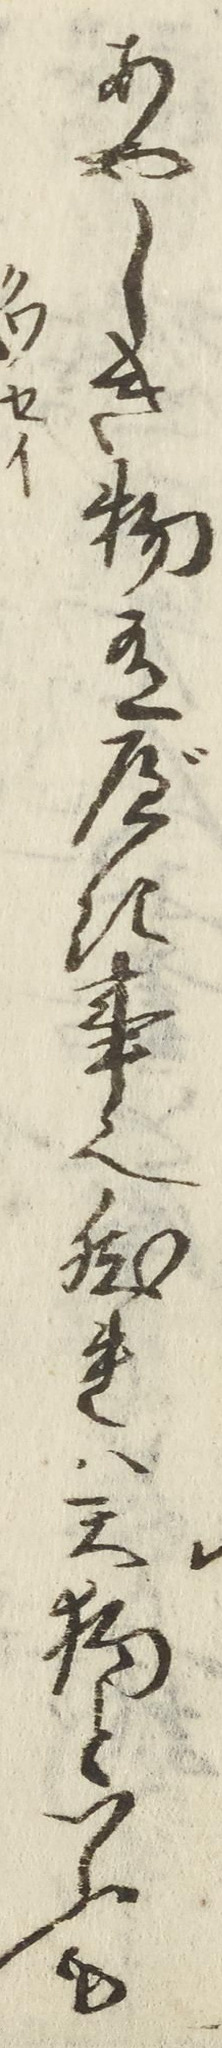あやしき物有べき事也然れは天狗といふも
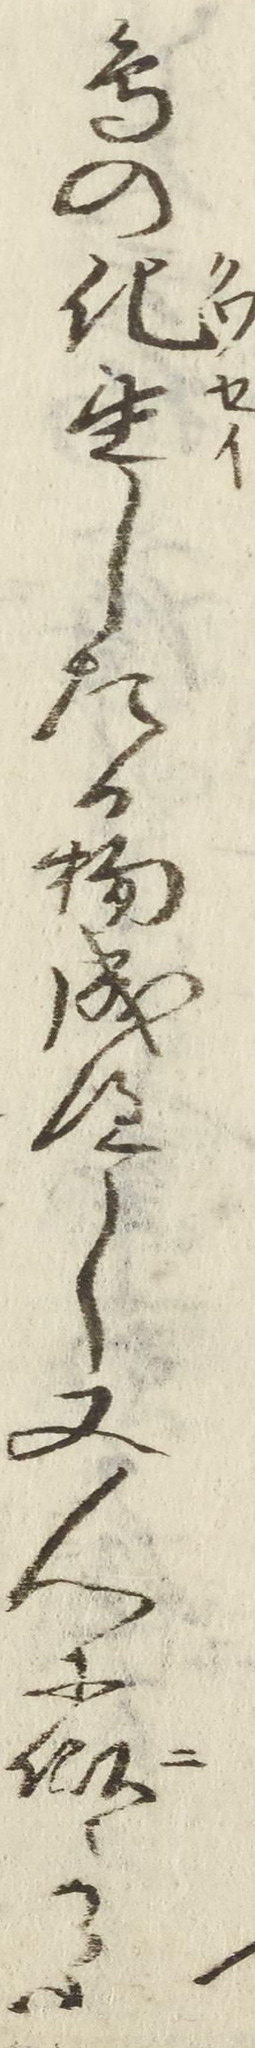鳥の化生したる物成へし又人に似たる事
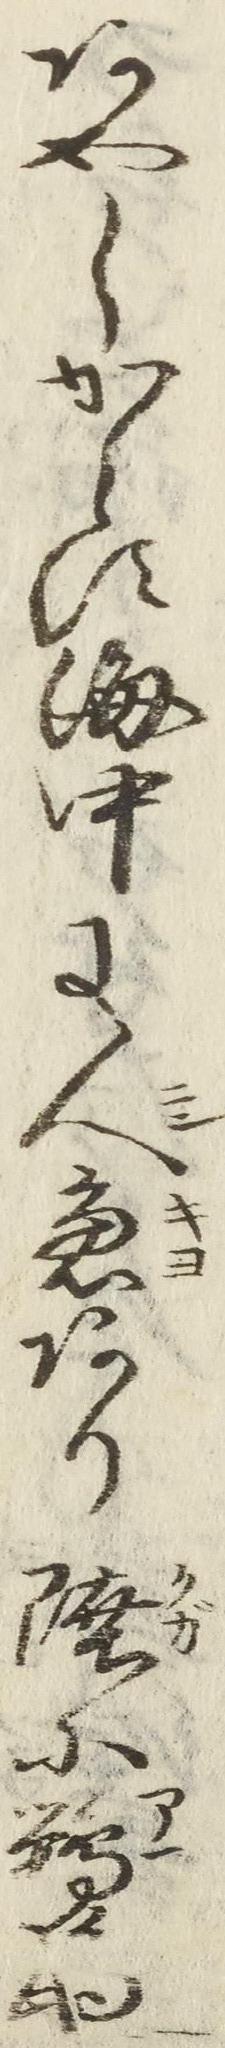あやしからす海中に人魚あり陸に鸚鵡
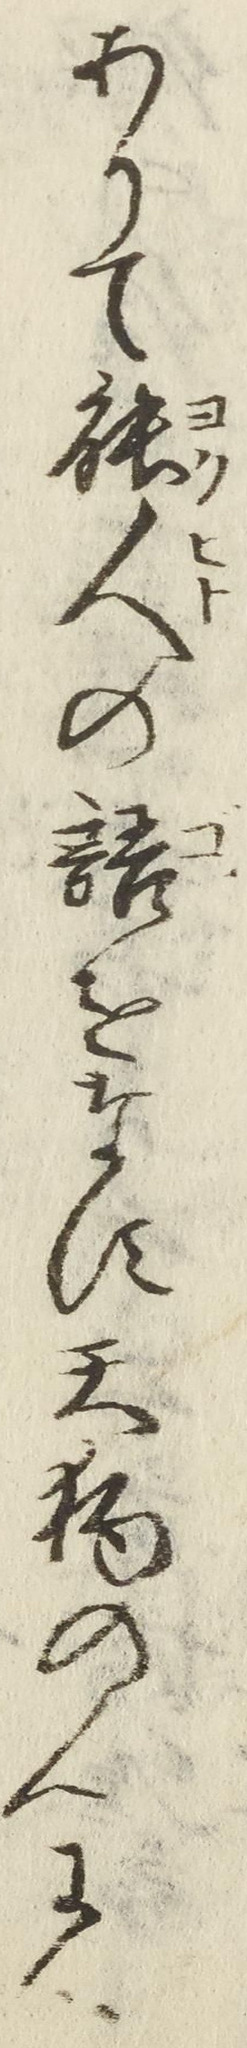ありて能人の語をなす天狗の人に似
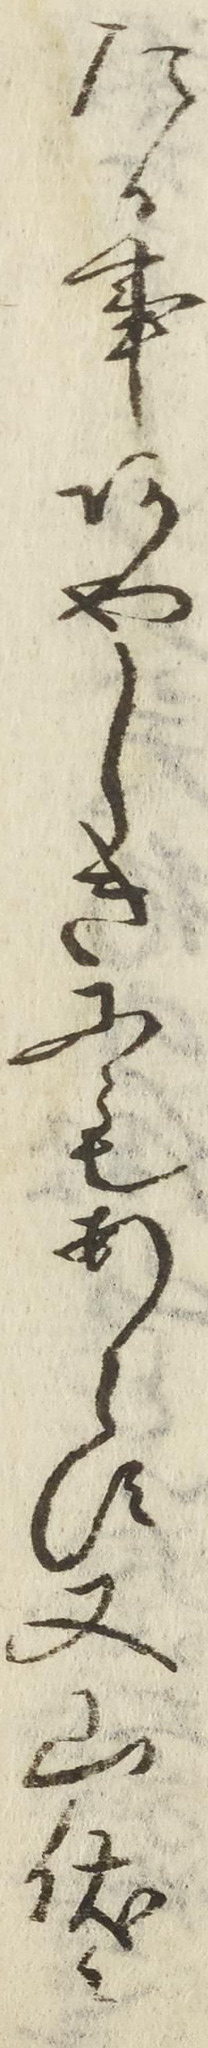たる事あやしきにもあらす又山伏の

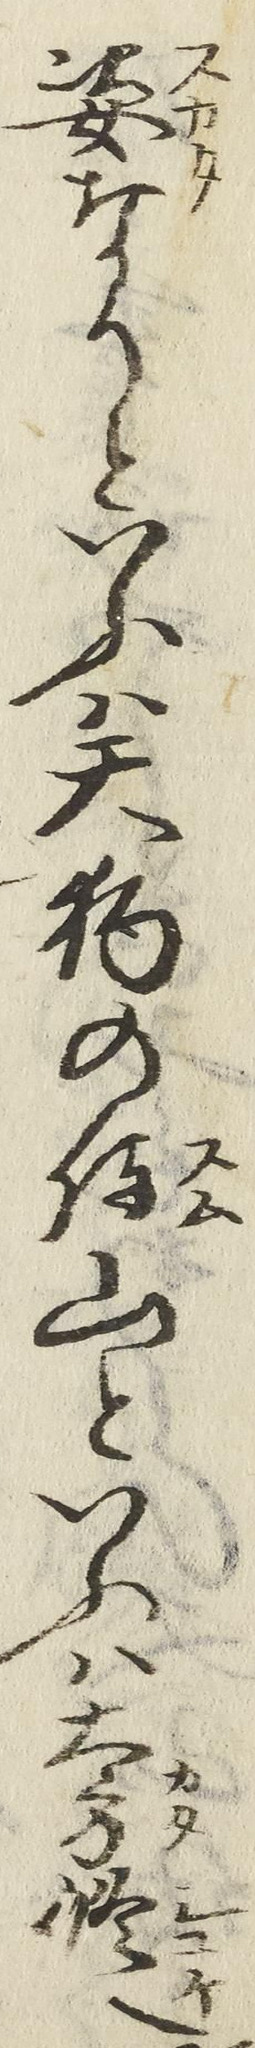姿なりといふは天狗の住山といふは大方修験
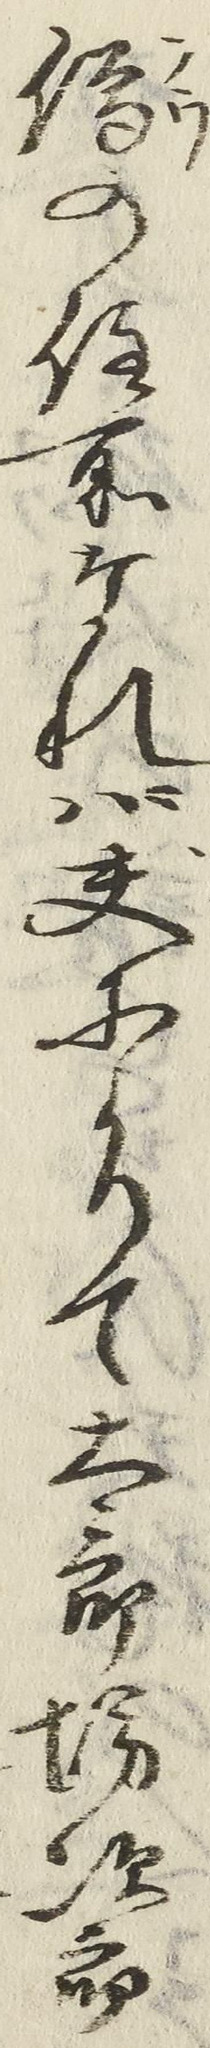僧の住所なれば夫によりて太郎坊次郎坊？
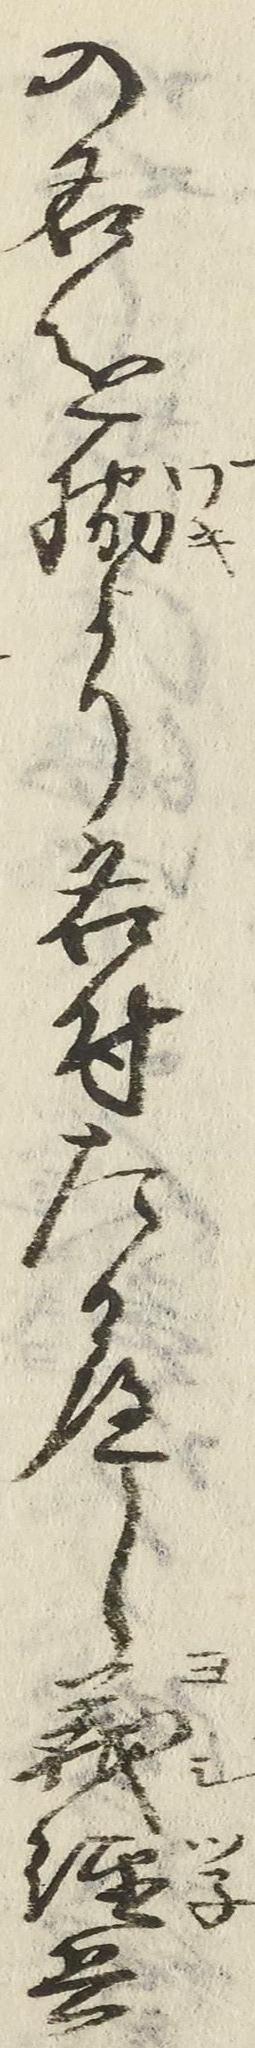の名を脇より名付たるへし義経兵法？
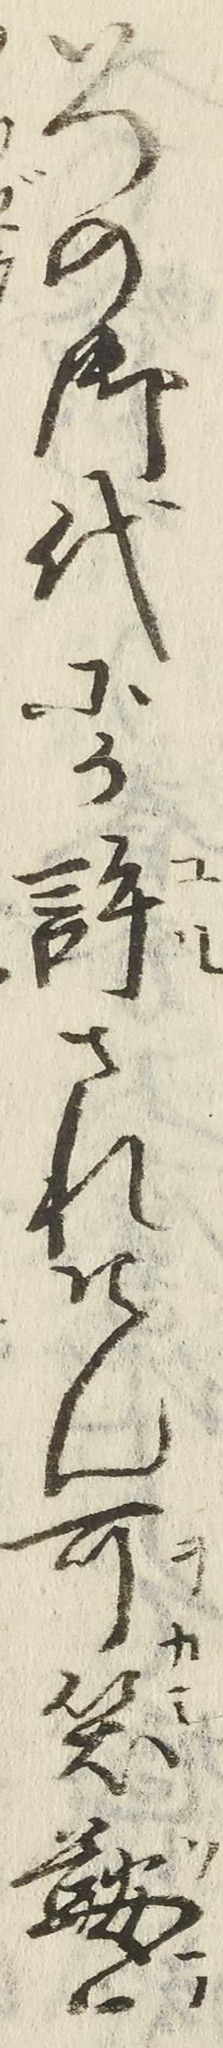いつの御代にか許されけん可笑鞍馬の
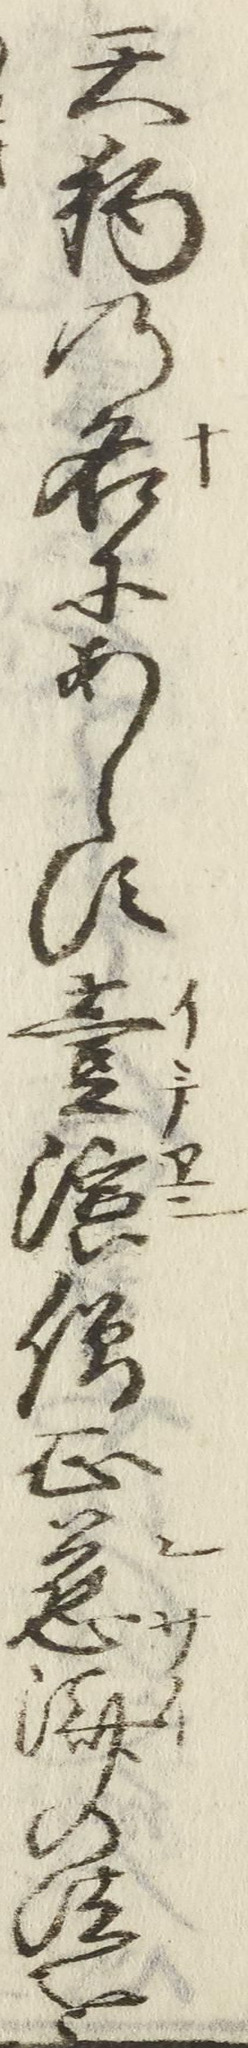天狗の名にあらす壹演僧正慈済の法を
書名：天地或問珍　地
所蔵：東京大学地震研究所図書室 Earthquake Research Institute Library, The University of Tokyo, JAPAN
